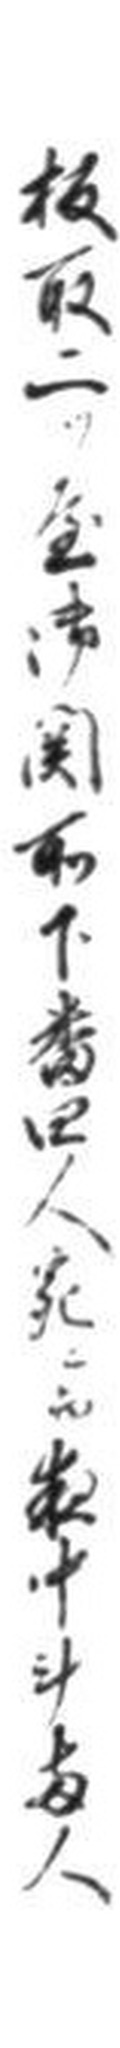板取二ツ屋御関所下番四人宛ニ而夜中斗両人
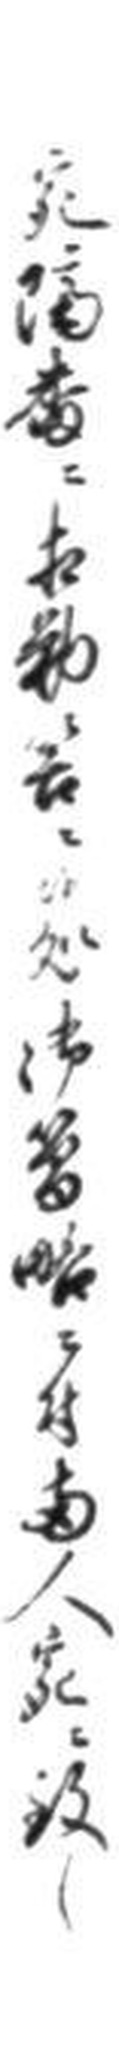宛隔番ニ相勤筈ニ候処御簡略ニ付両人宛ニ致し
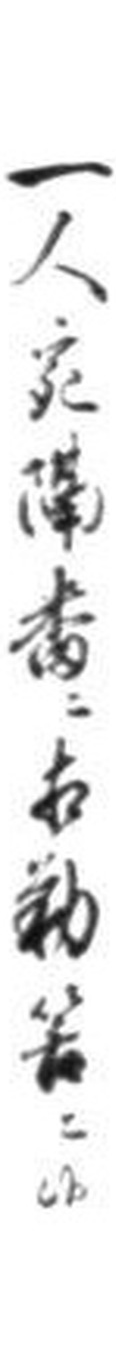一人宛隔番ニ相勤筈ニ候
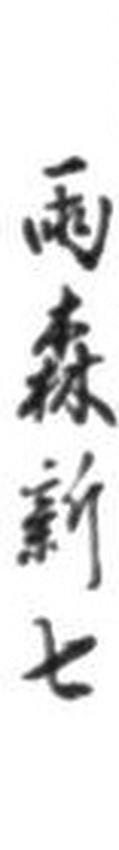雨森新七
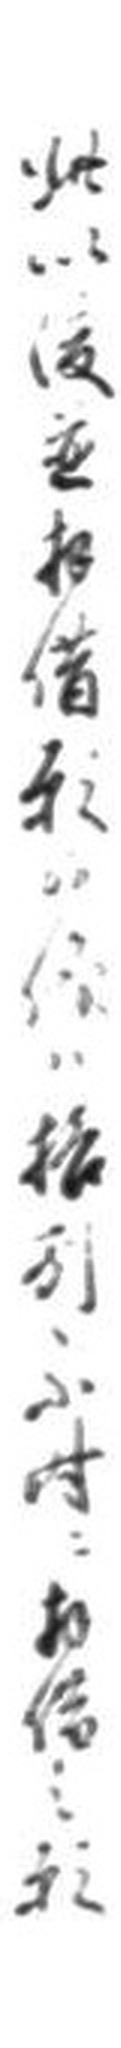此以後並拝借願候儀ハ格別不時ニ拝借之願
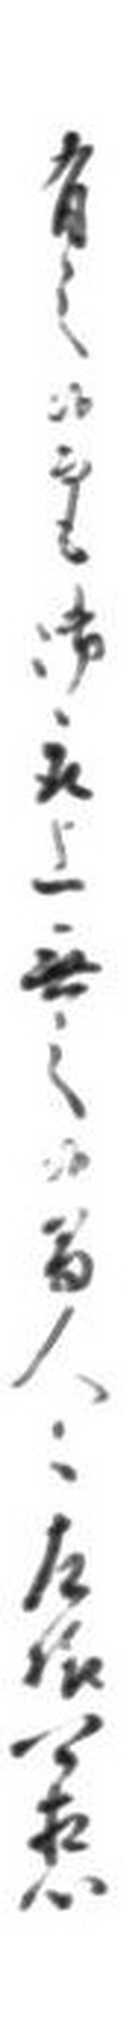有之候而も御取上無之候間人々左様可相心
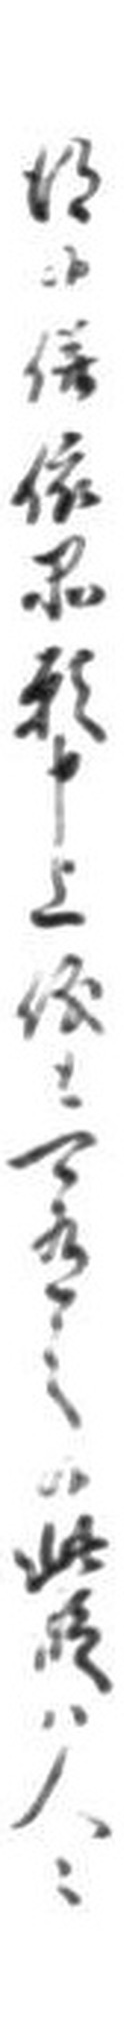得候併依品願申上儀も可有之候此段ハ人々
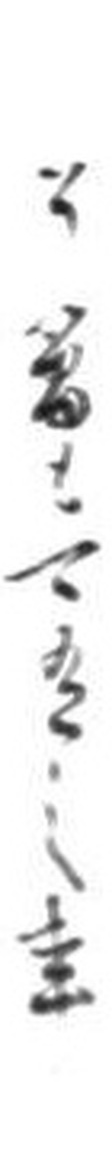了簡も可有之事
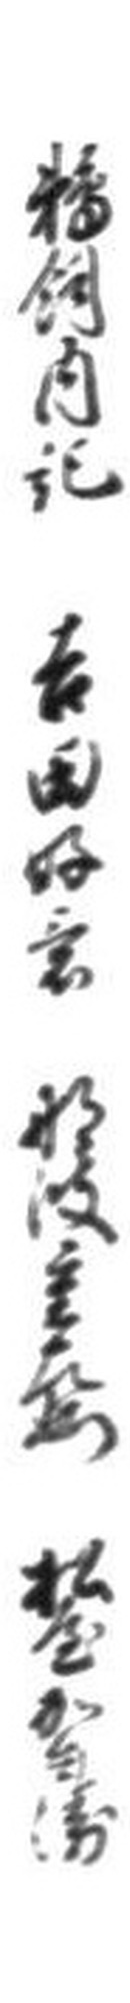鵜飼内記吉田好意野波重左衛門松屋加兵衛
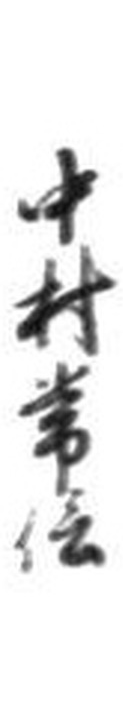中村常信
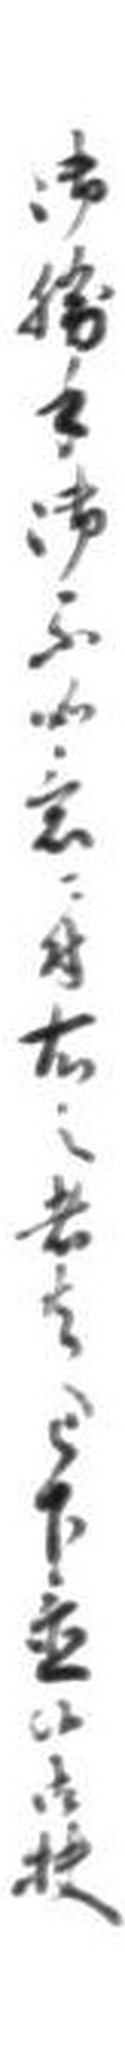御勝手御不如意ニ付右之者共へ被下置候御扶
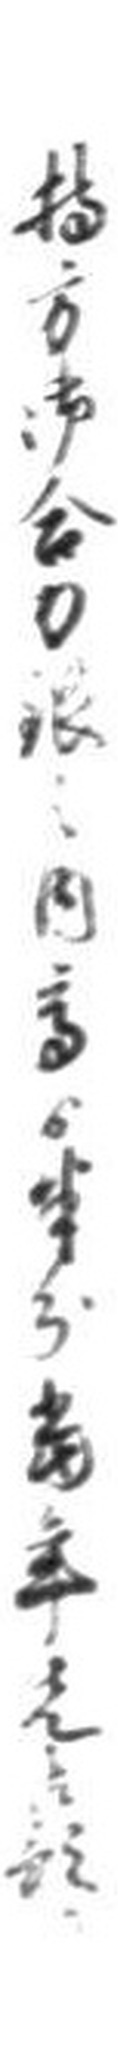持方御合力銀之内高ゟ半分当年先御預り
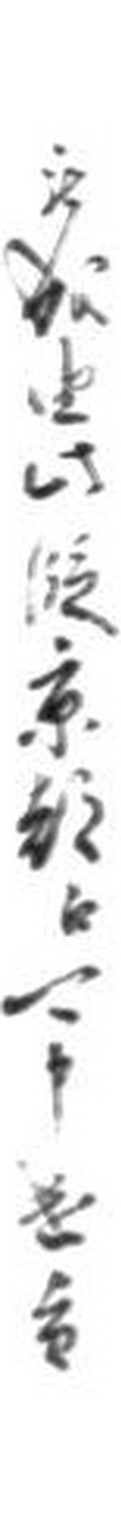被成由此段京都江可申遣旨

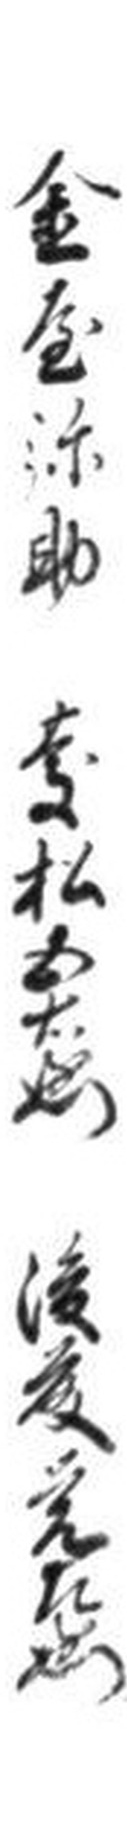金屋弥助慶松五右衛門後藤覚左衛門
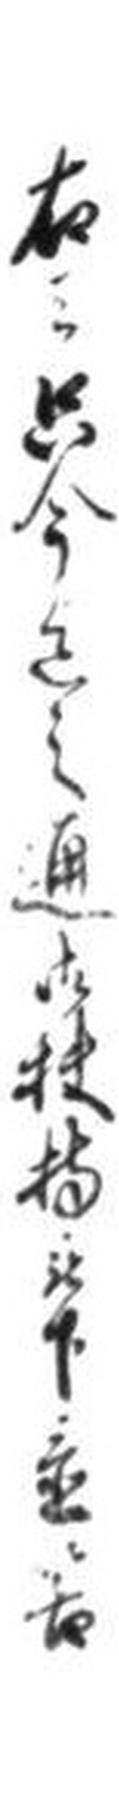右者只今迄之通御扶持被下置筈
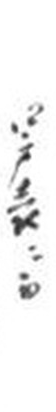江戸表ニ而
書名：家譜 三十六 宗昌公 従享保八年到同九年
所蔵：福井県文書館 Fukui Prefectural Archives
